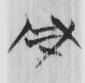凡
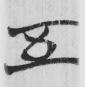五
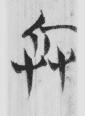兵
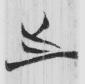之
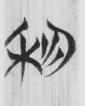利
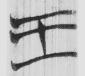王
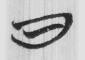日
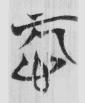{元心}
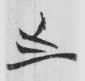之
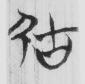居
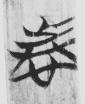者
